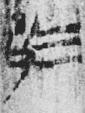於
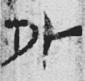外
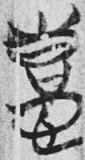憙（喜）
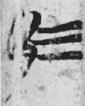於
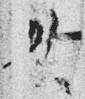外
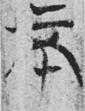不
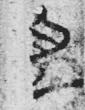見
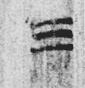於
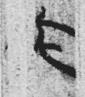內
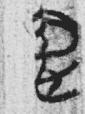○（慍）
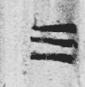於
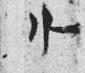外
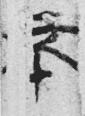不
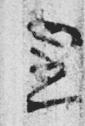見
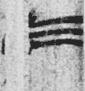於
